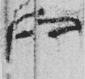夂（終）
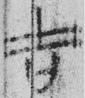吉
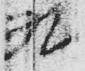九
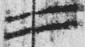二
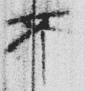不
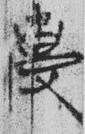尅
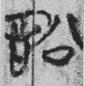訟
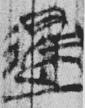○（歸）
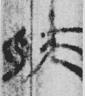肤（逋）
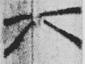亓（其）
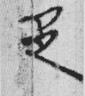邑
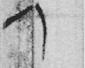人
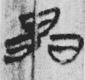晶（三）
